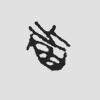者
